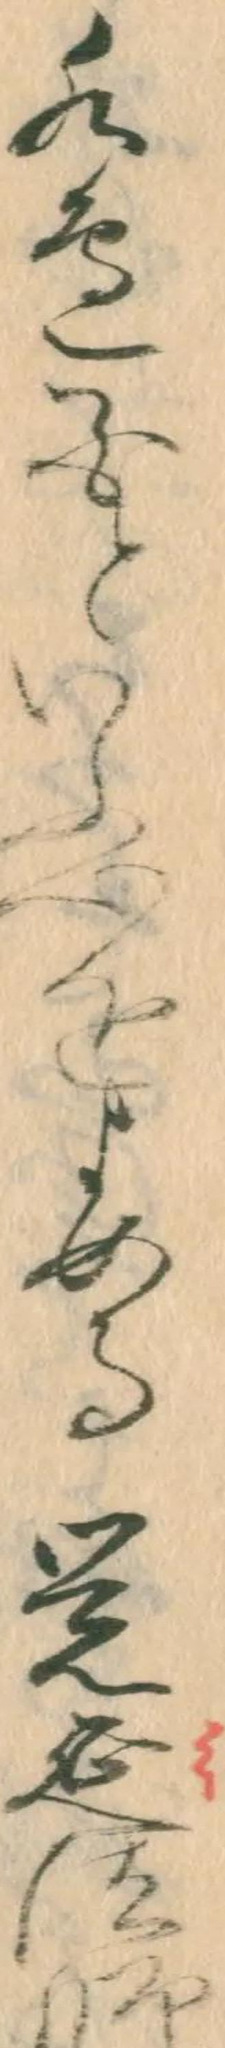水辺花といふ心をよめる覚延法師
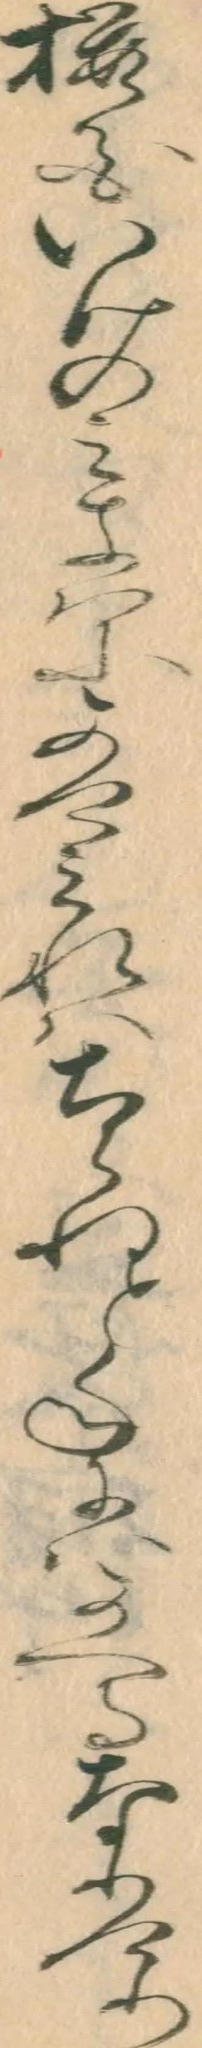桜花いけのみきはにかけみれはちらねとねにはかへるなりけり
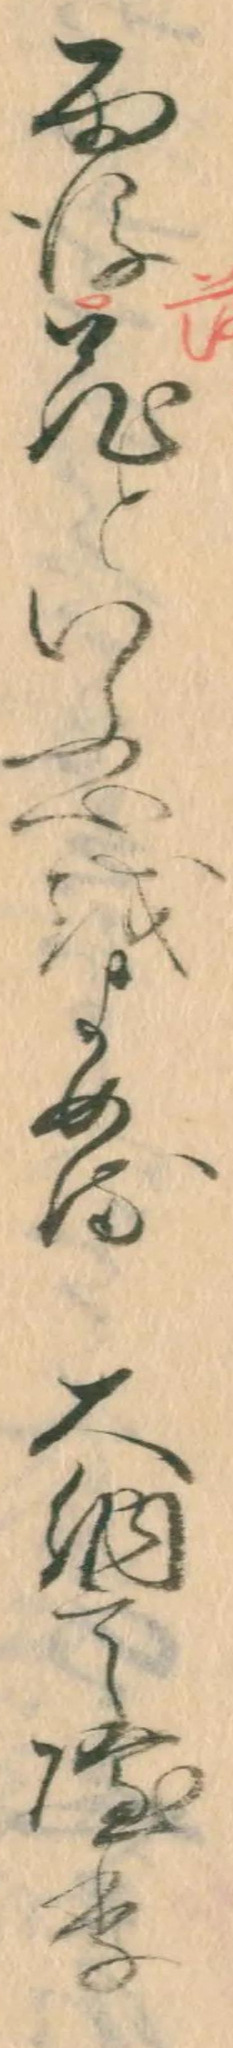雨後◦花といふ心をよめる大納言隆季
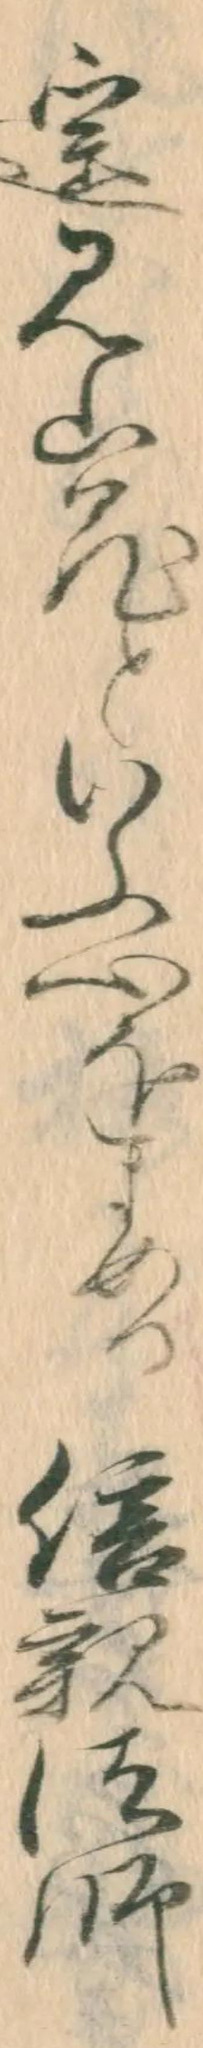遥見山花といふ心をよめる信親法師
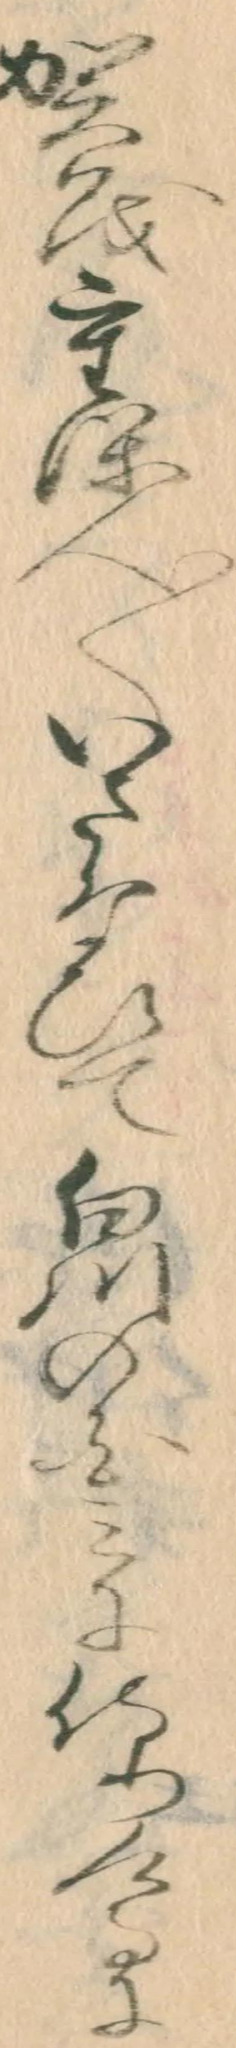賀茂重保人〳〵いさなひて白川の花見に侍りけるに
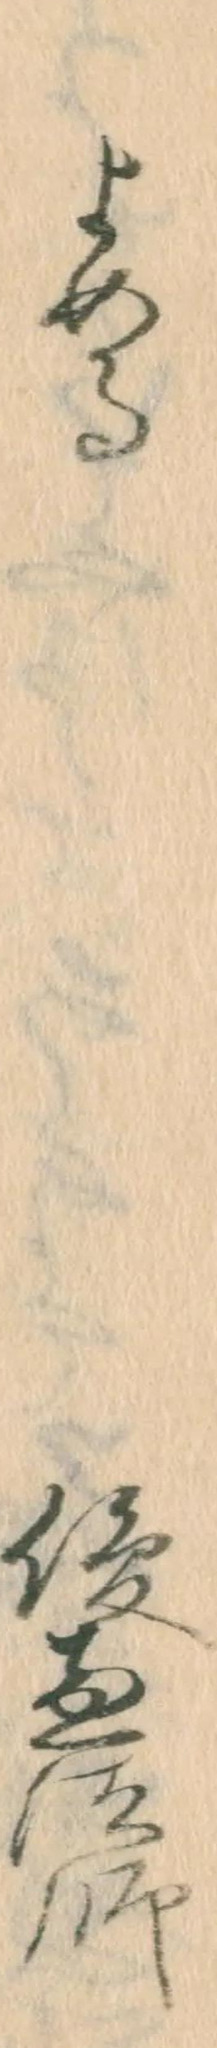よめる俊恵法師
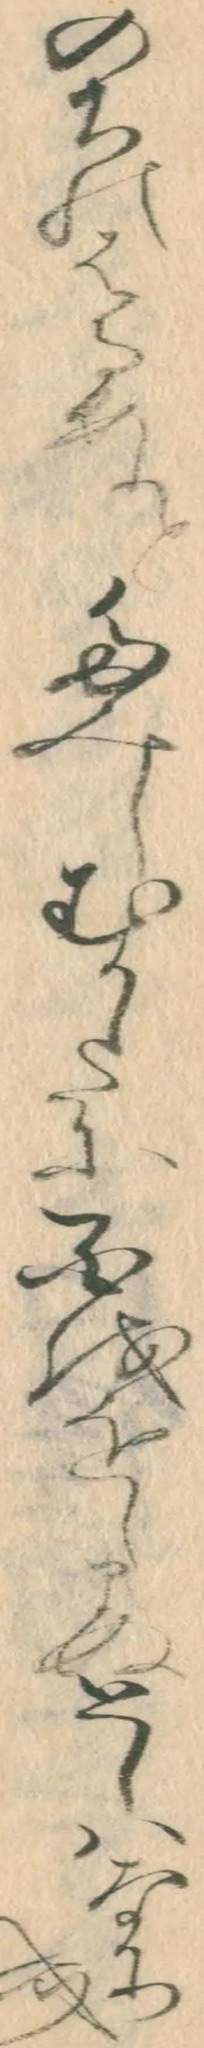のちのはるありとたのしむゝかしたに花ををしまぬとしはなかりき
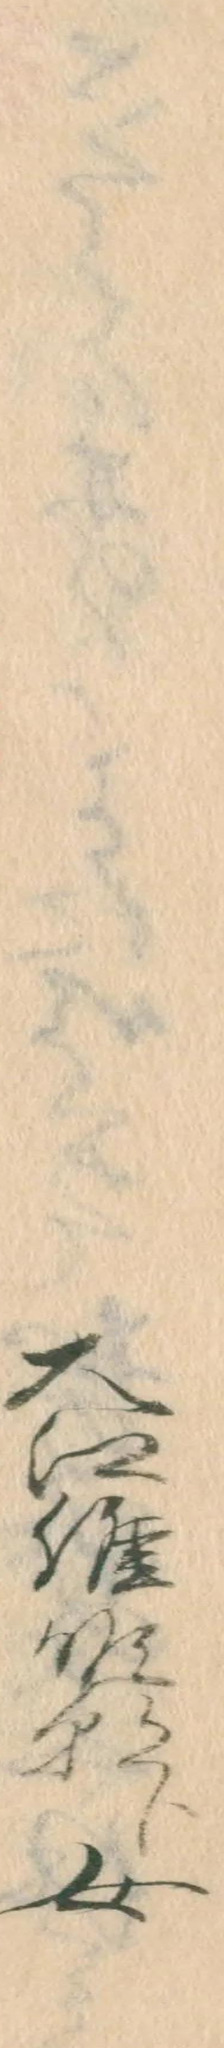大江維順朝臣女
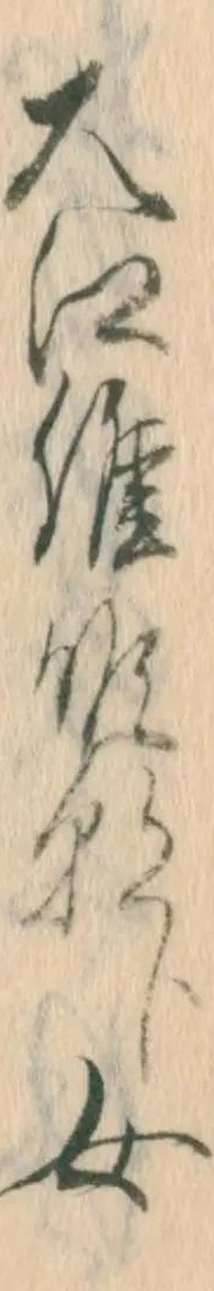大江維順朝臣女
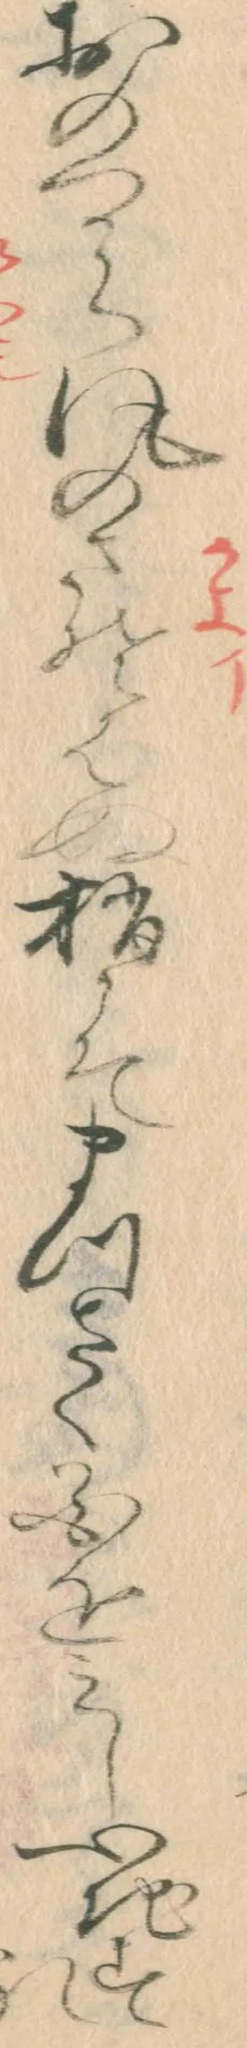おのつから風のさそはぬ梢こそまつさく花をみし心地すれ
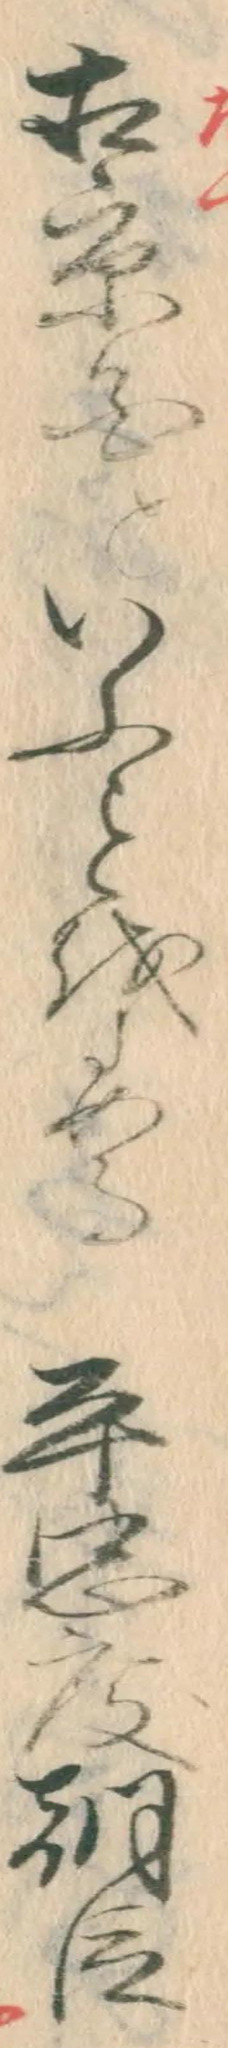古京花といふことをよめる平忠度朝臣
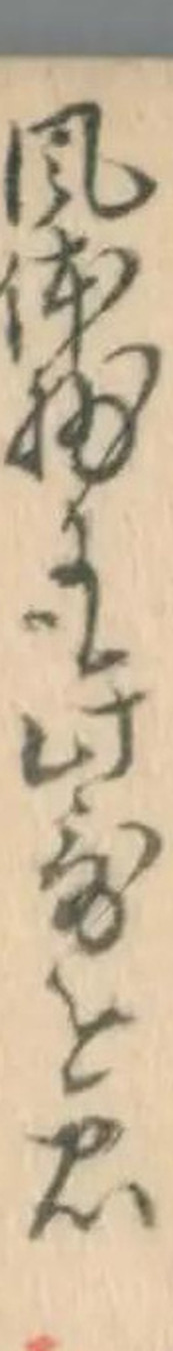風体抄にも此歌を忠
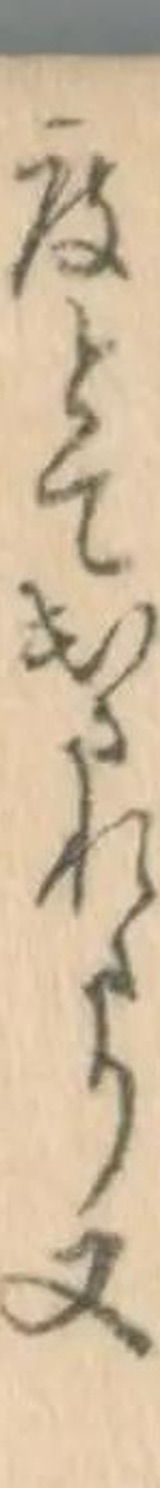度とて出されたり又
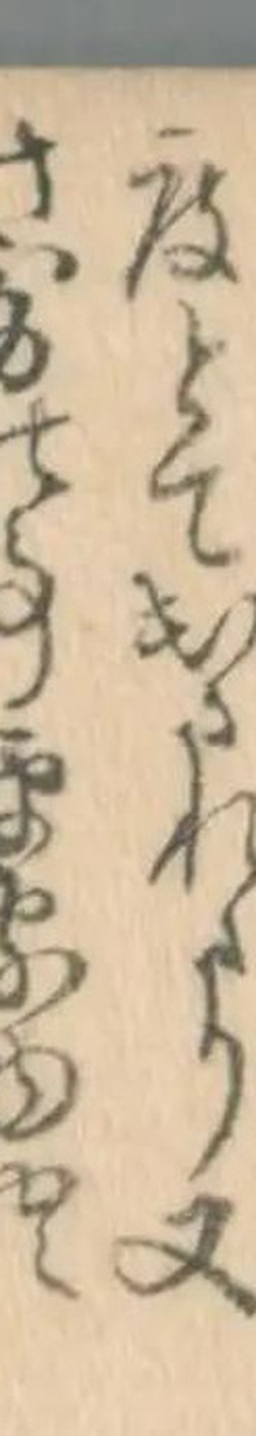此歌の事平家物語
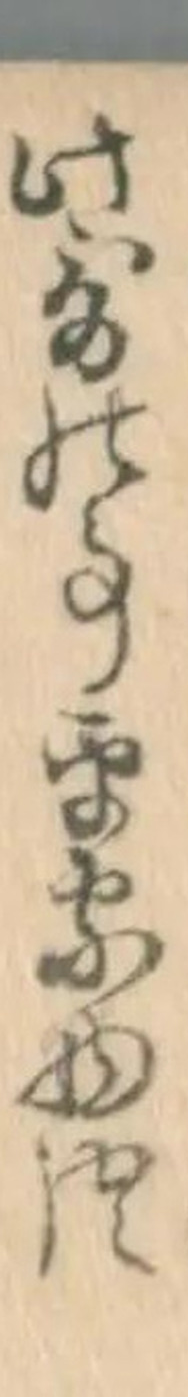此歌の事平家物語
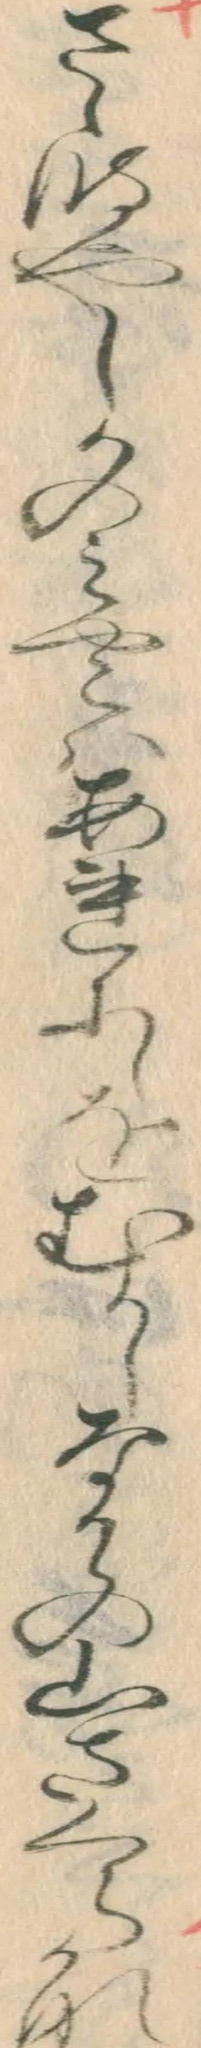さゝ波やしかのみやこはあれにしをむかしなからの山さくらかな
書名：月詣和歌集
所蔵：国立国会図書館 National Diet Library, JAPAN
